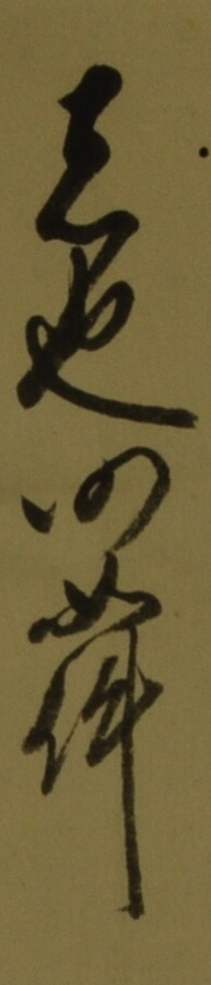者也仍如件
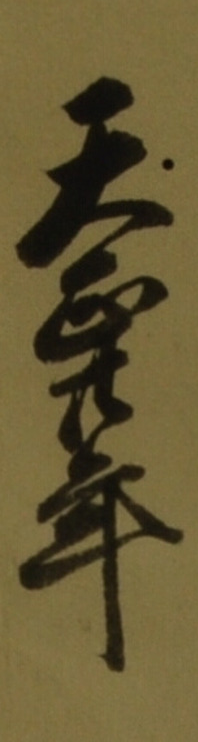天正廿年
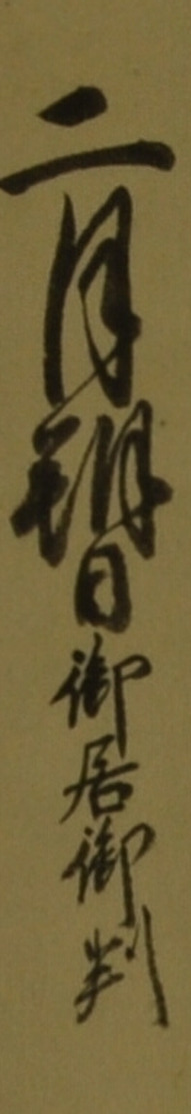二月朔日御居御判
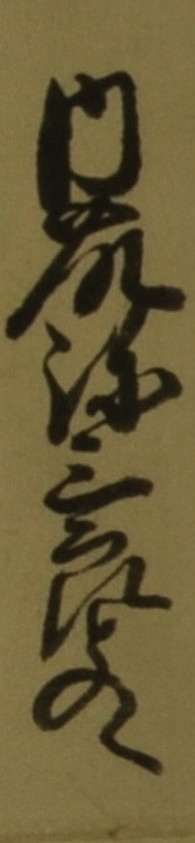内藤弥三郎とのへ
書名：御判物〔写〕
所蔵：伊那市立高遠町図書館・合同会社AMANE
